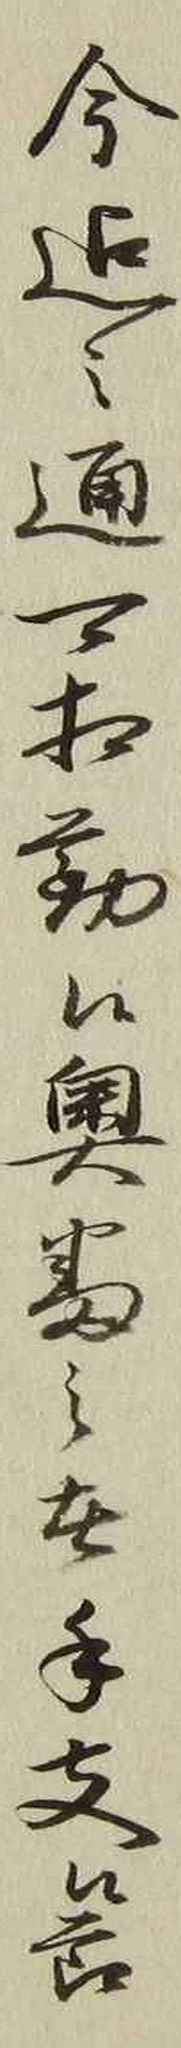今迄之通可相勤候奥番之者手支候節
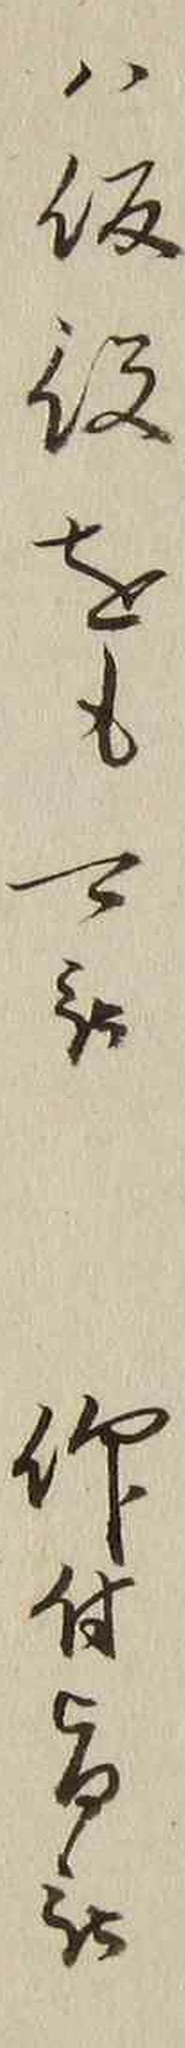は仮役をも可被仰付旨被
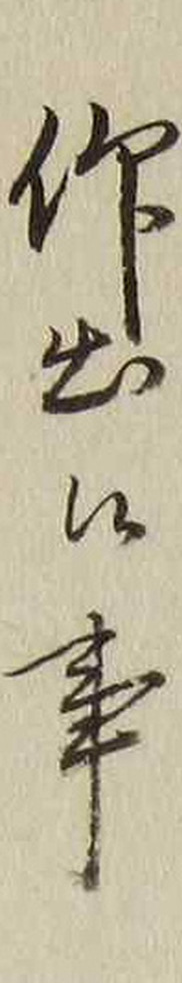仰出候事
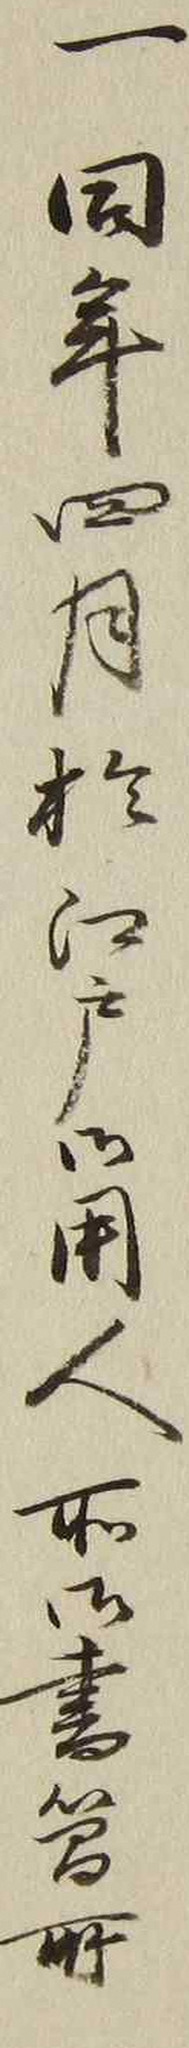一同年四月於江戸御用人所御書簡所
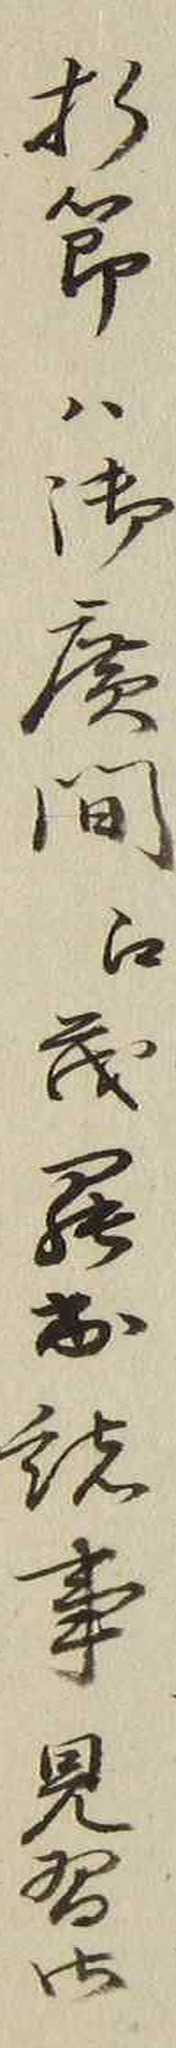折節は御広間江も罷出諸事見習御
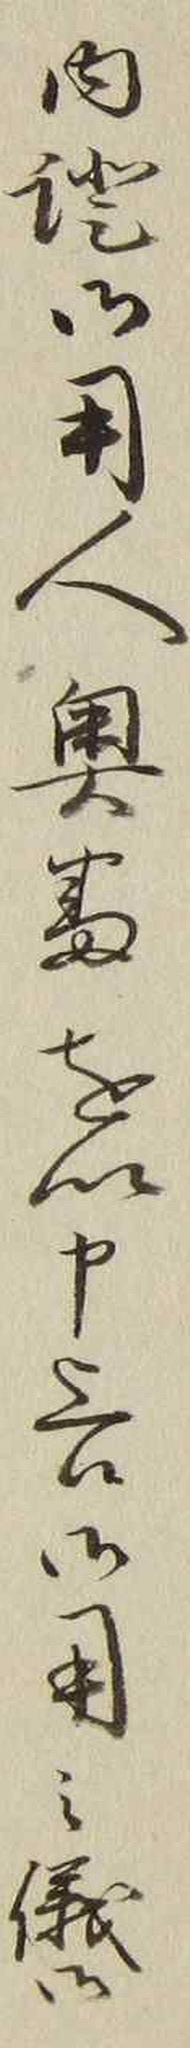内証御用人奥番を以申上候御用之儀御
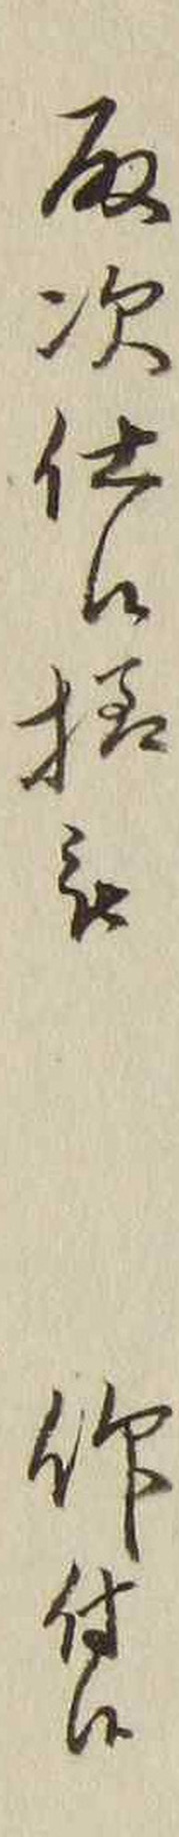取次仕候様被仰付候

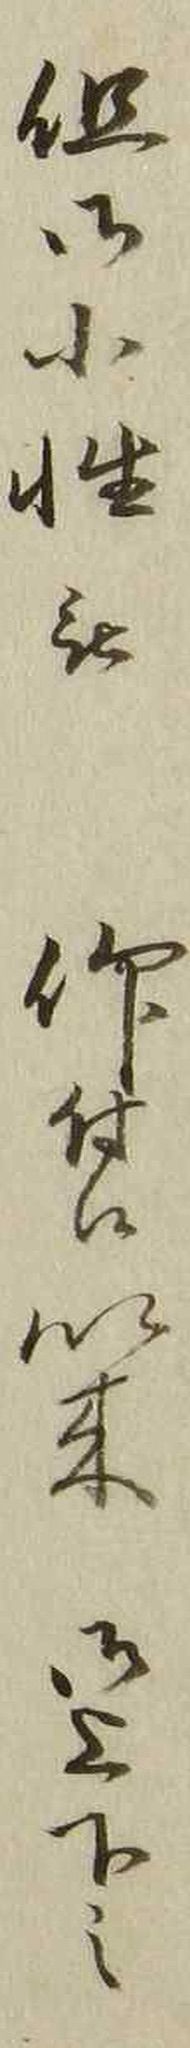但御小性被仰付候以来御上下之
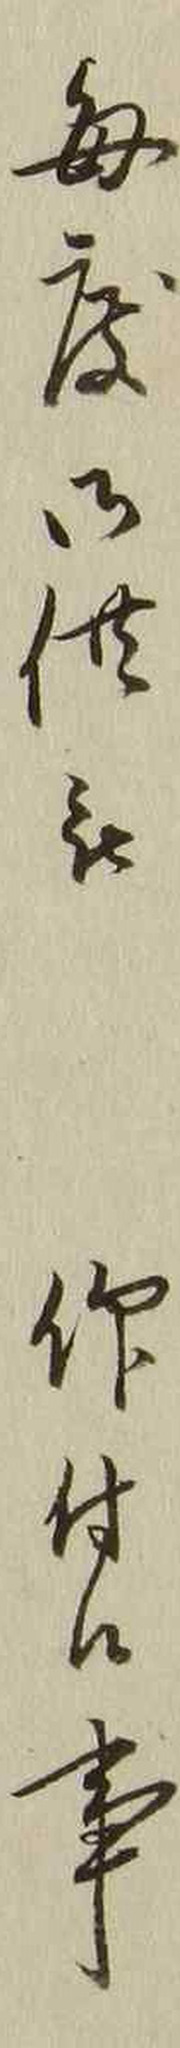毎度御供被仰付候事
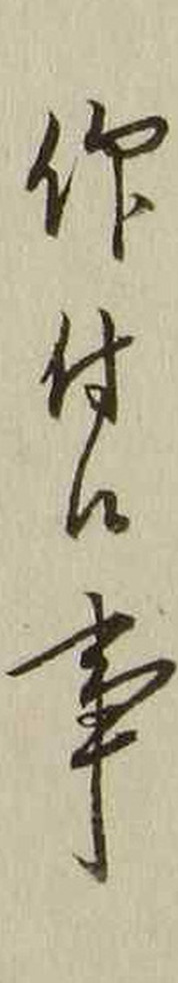仰付候事
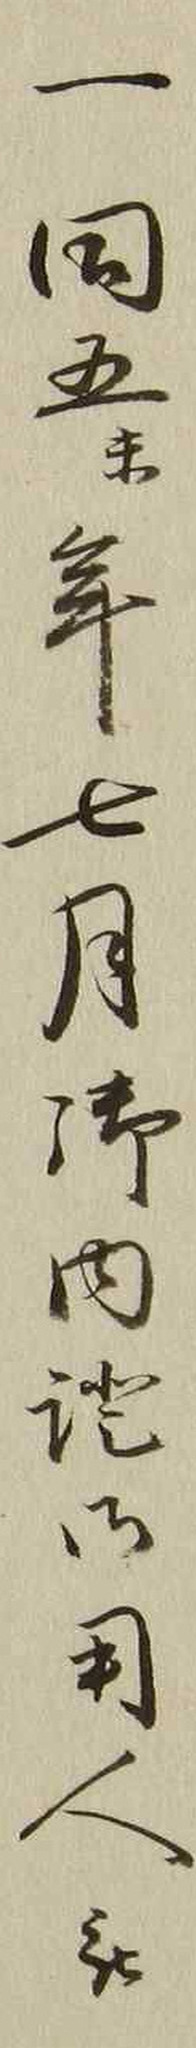一同五末年七月御内証御用人被
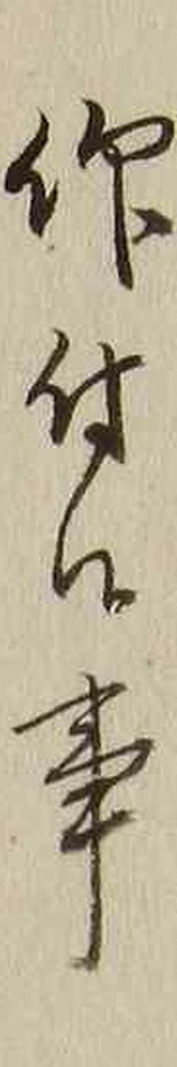仰付候事
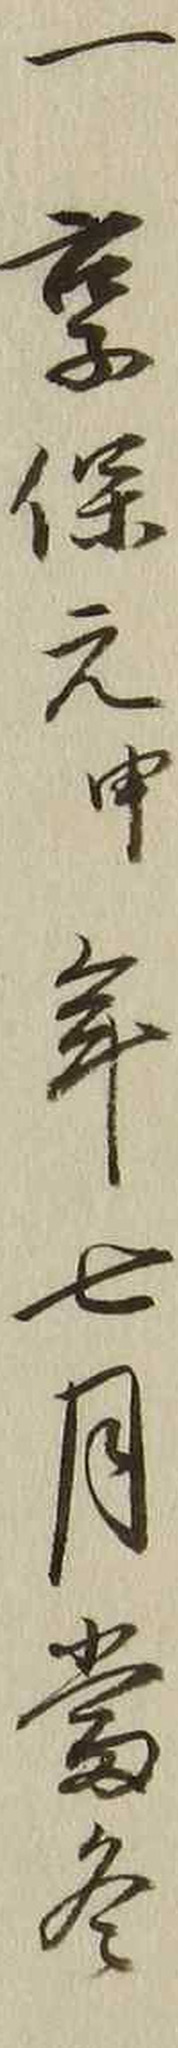一享保元申年七月当冬
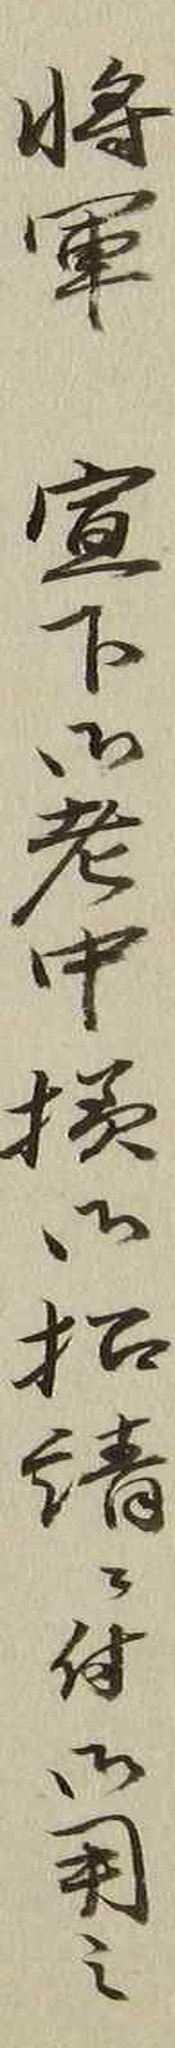将軍宣下御老中様御招請に付御用之
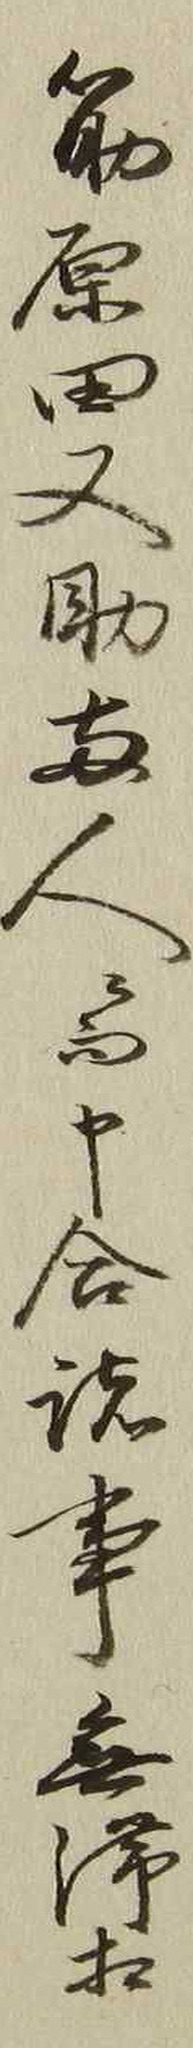筋原田又助両人馬に而申合諸事無滞相
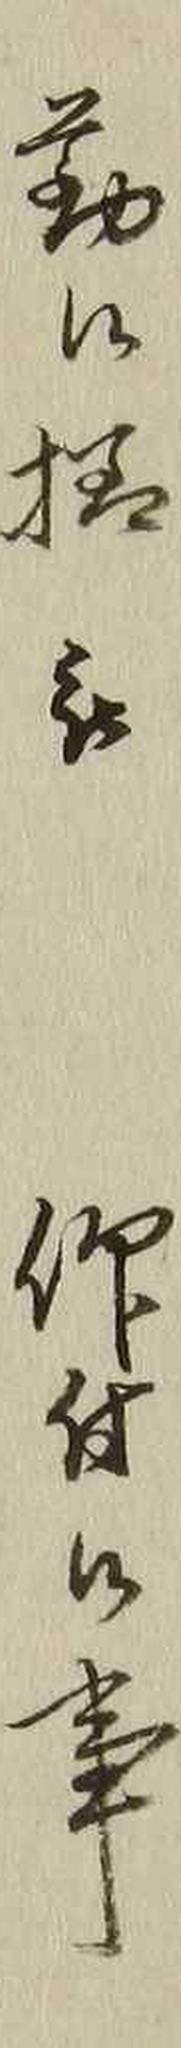勤候様被仰付候事
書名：諸士系譜　巻之133　た之部9
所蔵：会津若松市立会津図書館
